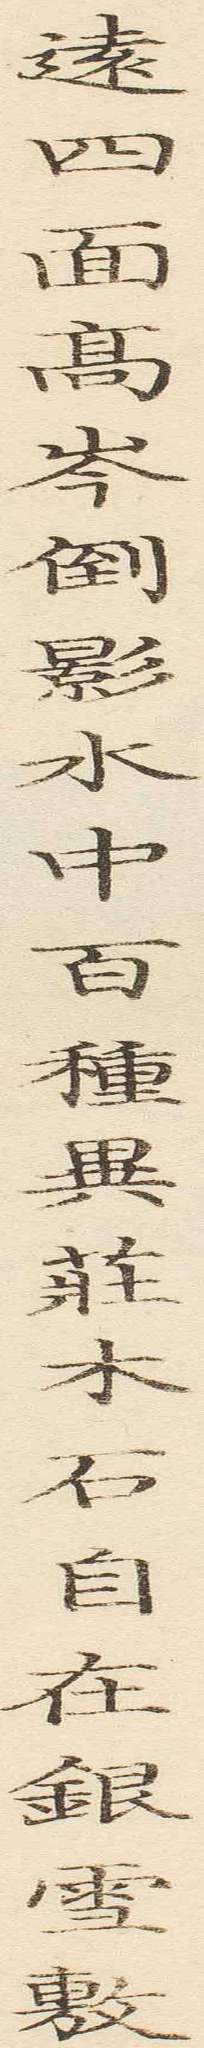遠四面髙岑倒影水中百種異莊木石自在銀雪敷
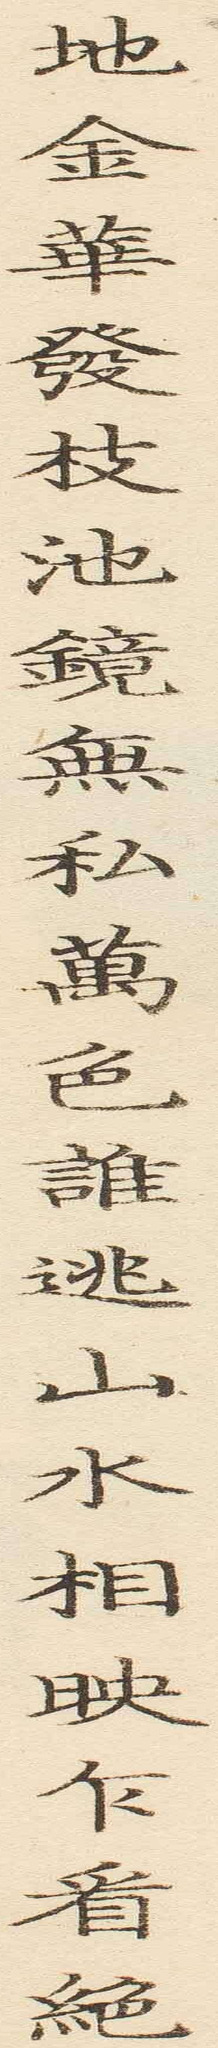地金華發枝池鏡無私萬色誰逃山水相映乍看絶
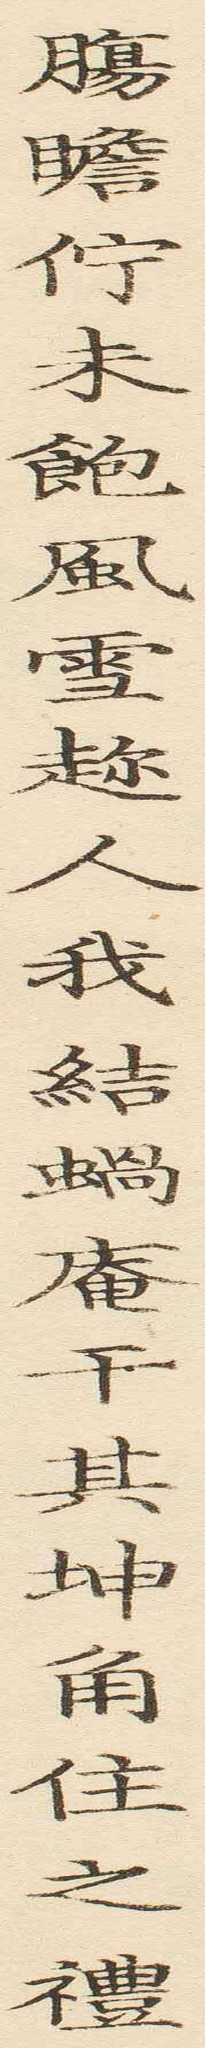膓瞻佇未飽風雪趂人我結蝸庵干其坤角住之禮
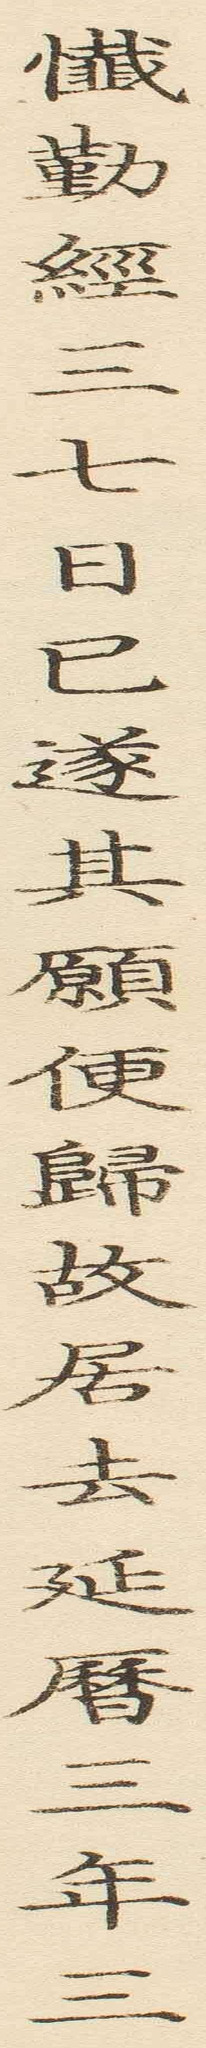懴勤經三七日已遂其願便歸故居去延曆三年三
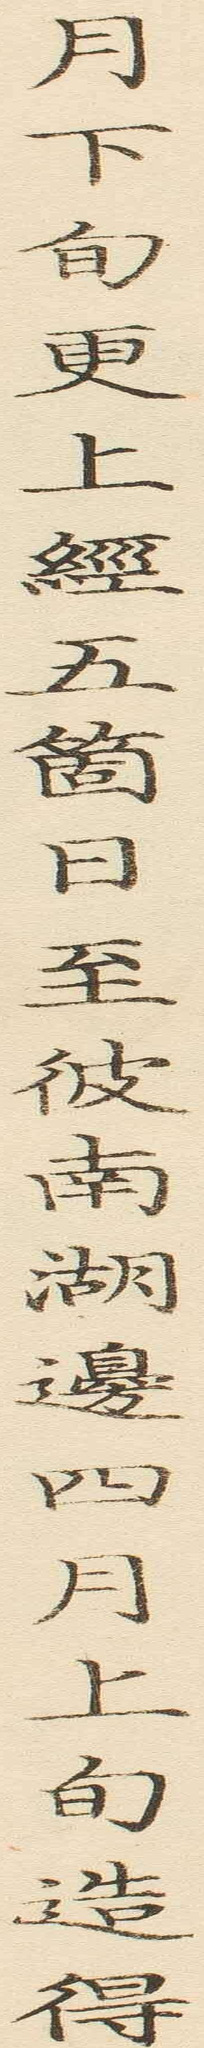月下旬更上經五箇日至彼南湖邊四月上旬造得
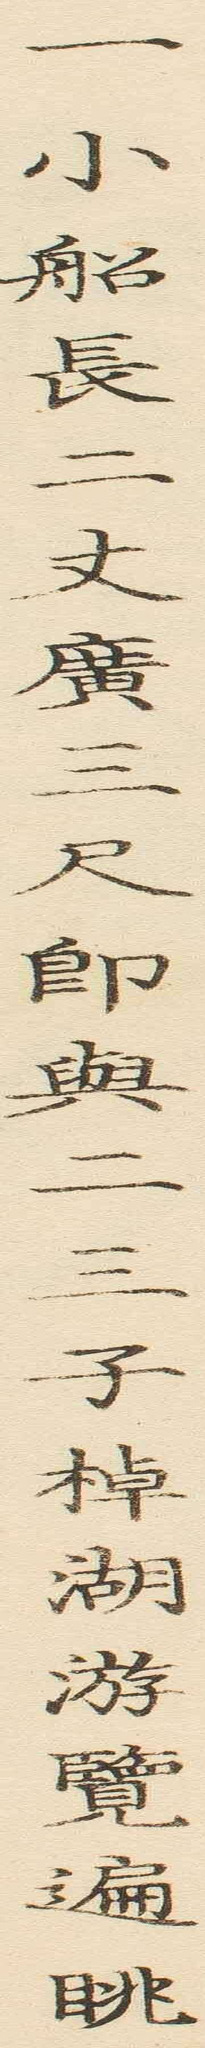一小船長二丈廣三尺卽與二三子棹湖游覽遍眺
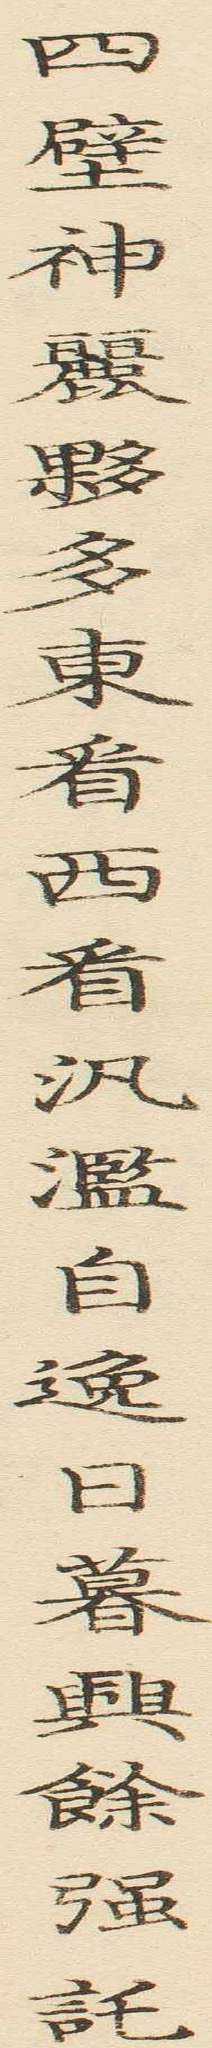四壁神麗夥多東看西看汎濫自逸日暮興餘强託
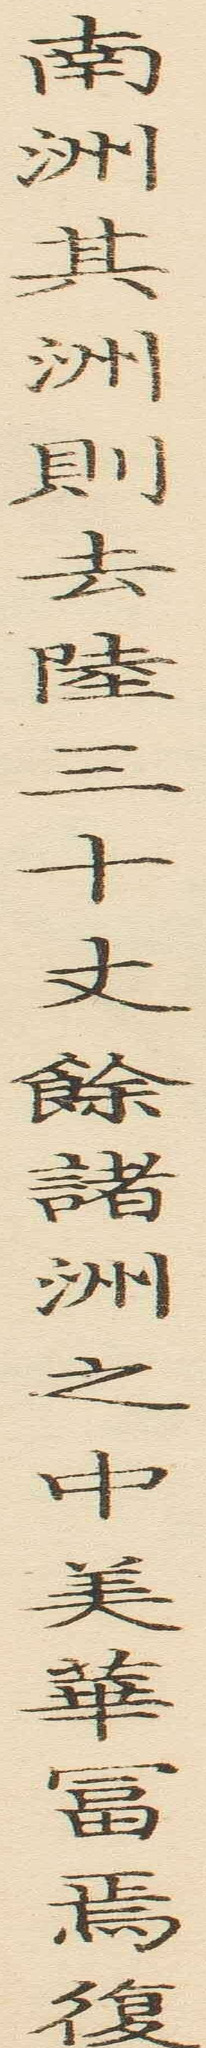南洲其洲則去陸三十丈餘諸洲之中美華冨焉復
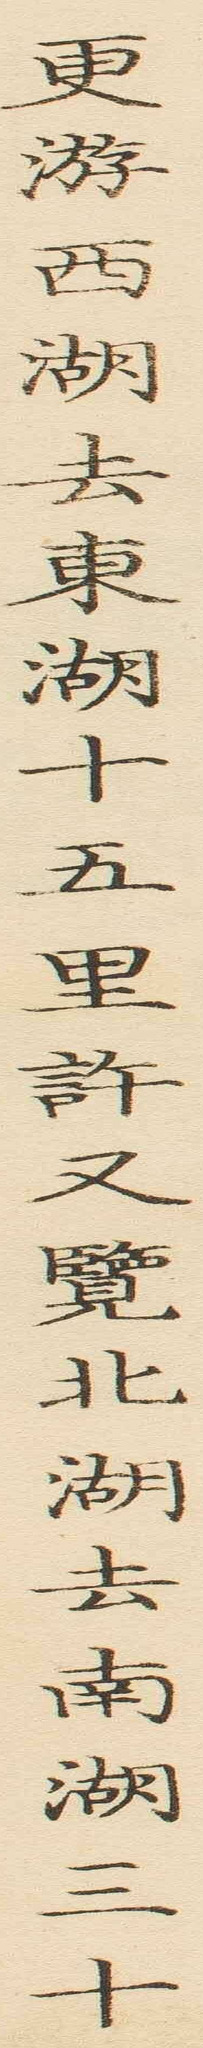更游西湖去東湖十五里許又覽北湖去南湖三十
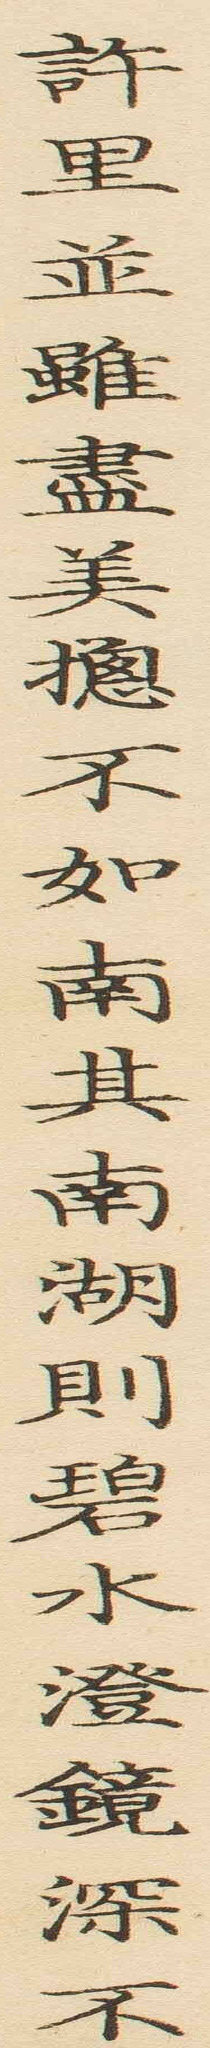許里並雖盡美摠不如南其南湖則碧水澄鏡深不

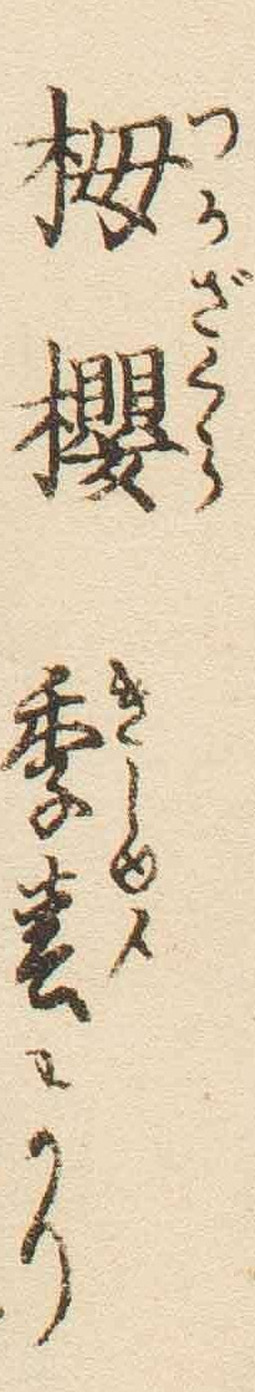栂櫻季春より
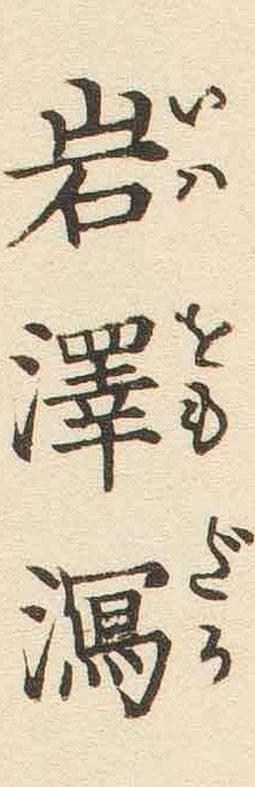岩澤㵼
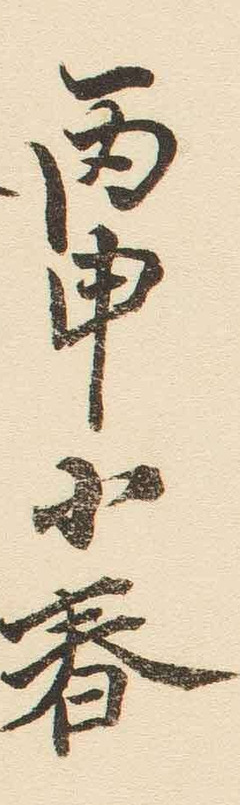丙申小春
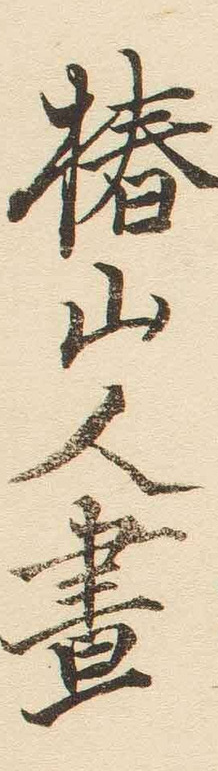椿山人晝

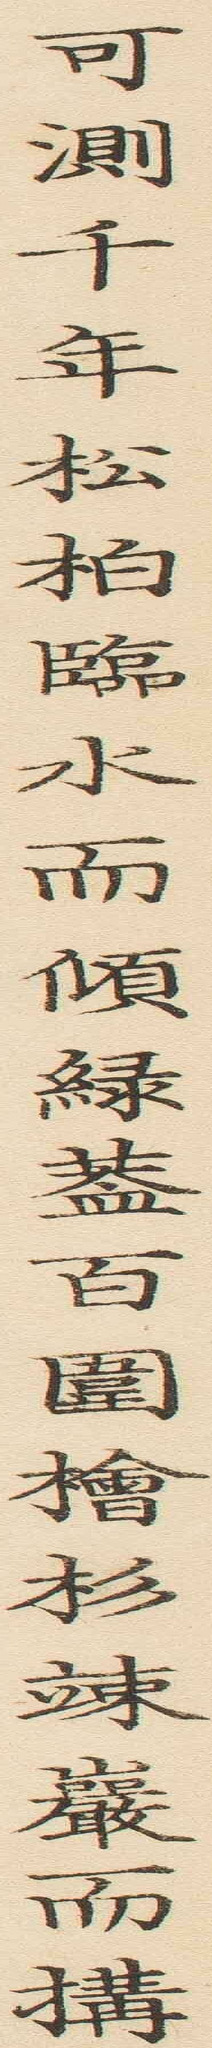可側千年松柏臨水而傾緑葢百圍檜杉竦巖而搆
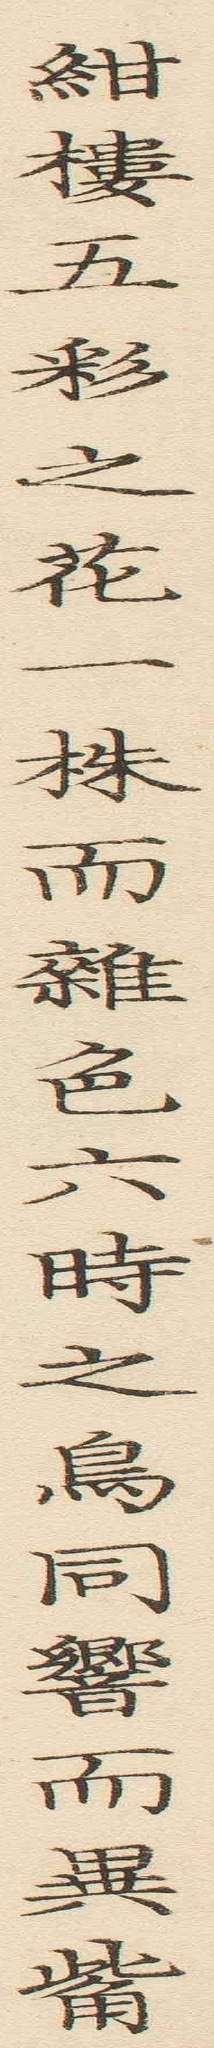紺樓五彩之花一株而雜色六時之鳥同響而異觜
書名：日光山志
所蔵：東京学芸大学附属図書館 国文学研究資料館
